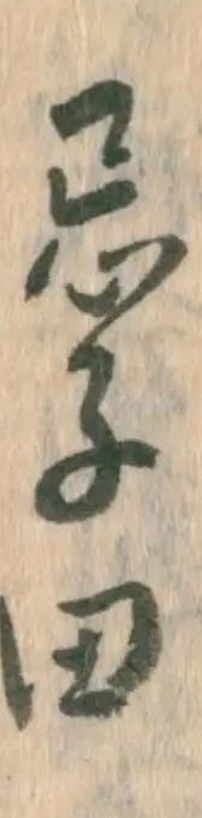忌子田
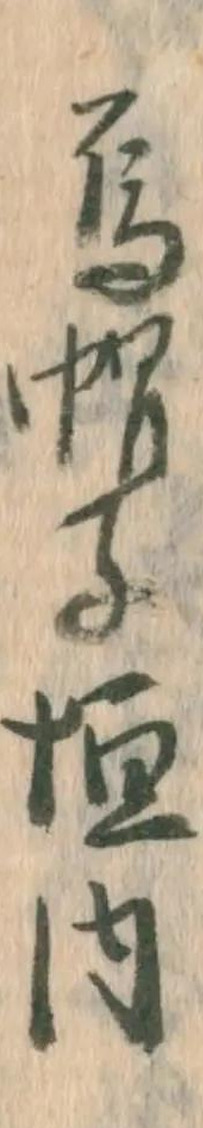烏帽子垣内
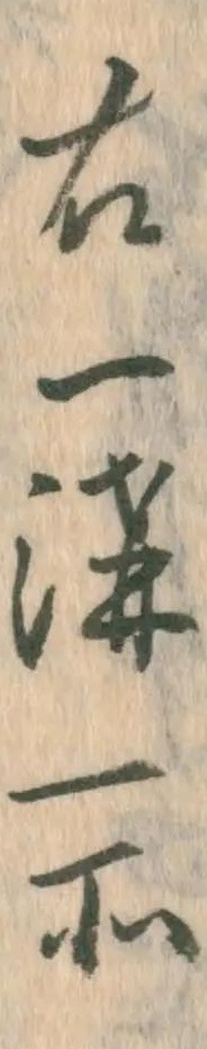右一溝一所
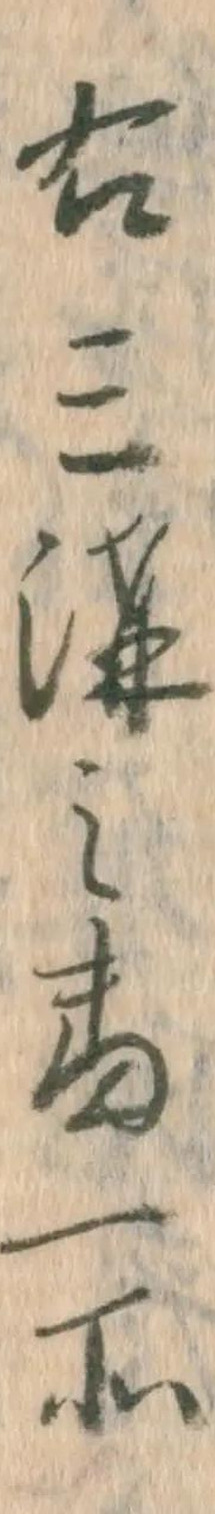右三溝之番一所
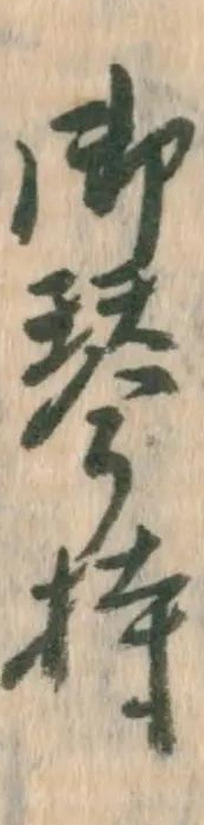御琴持
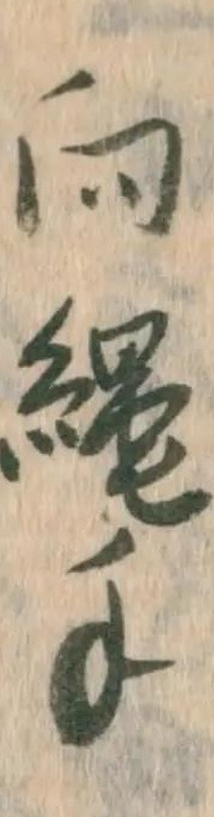向縄手
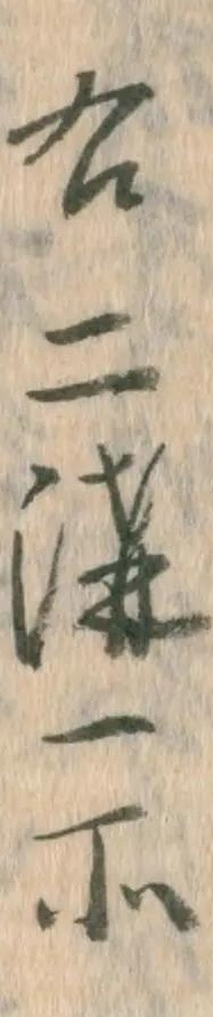右二溝一所
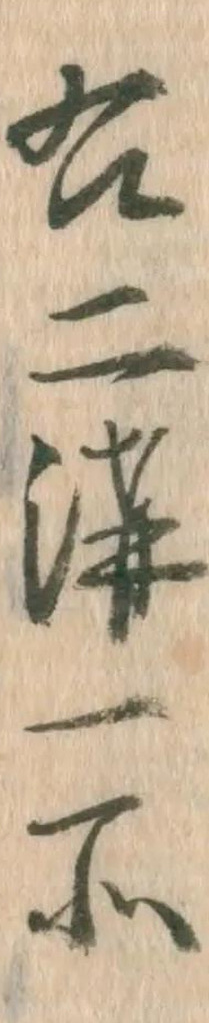右二溝一所
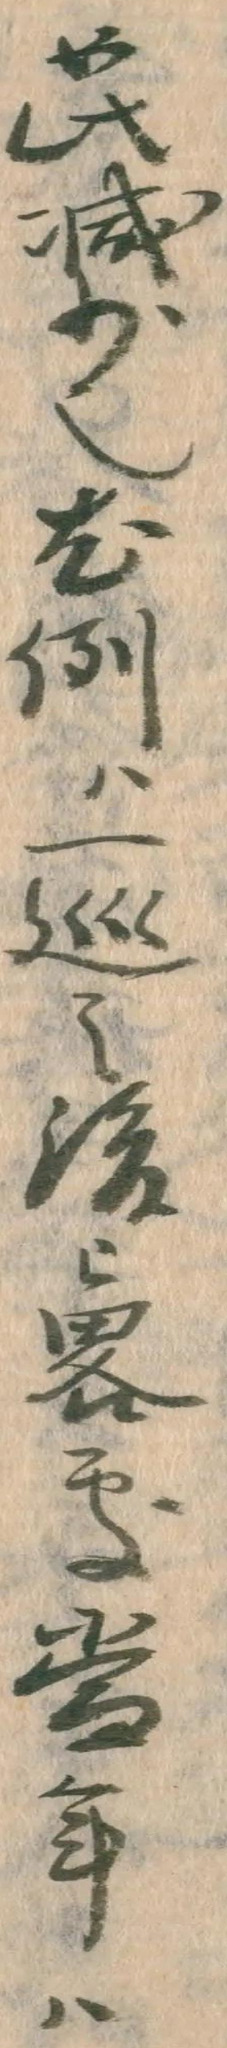如此減少也、尤例ハ一巡之後被略處、當年ハ
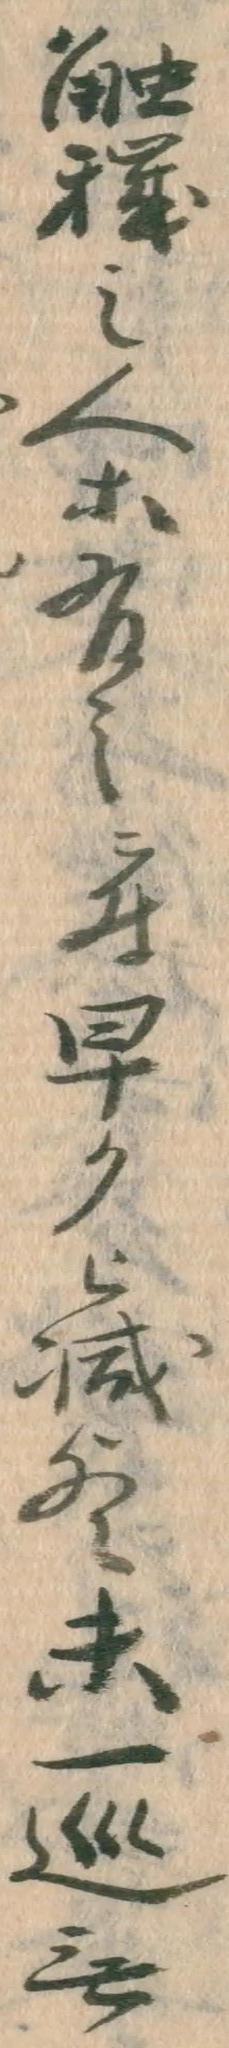触穢之人等有之ニ付、早ク被減歟、未一巡無
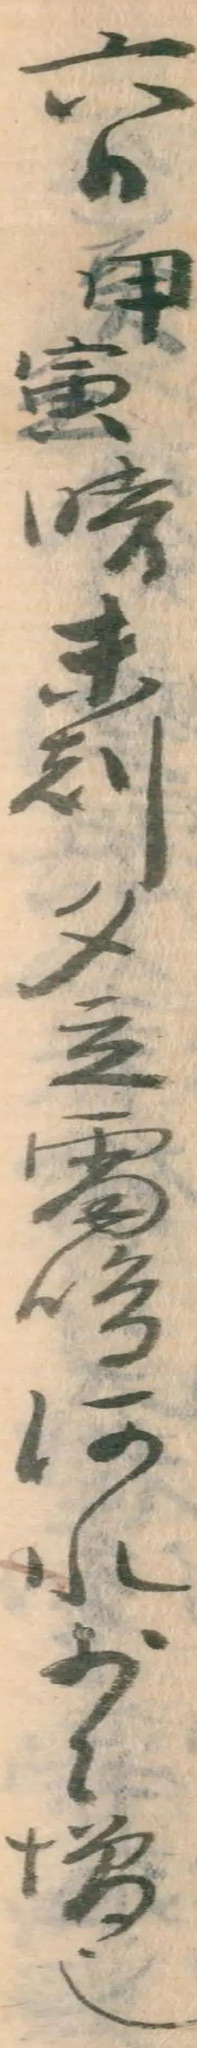六日甲寅晴未刻夕立雷鳴、河水少々増也、
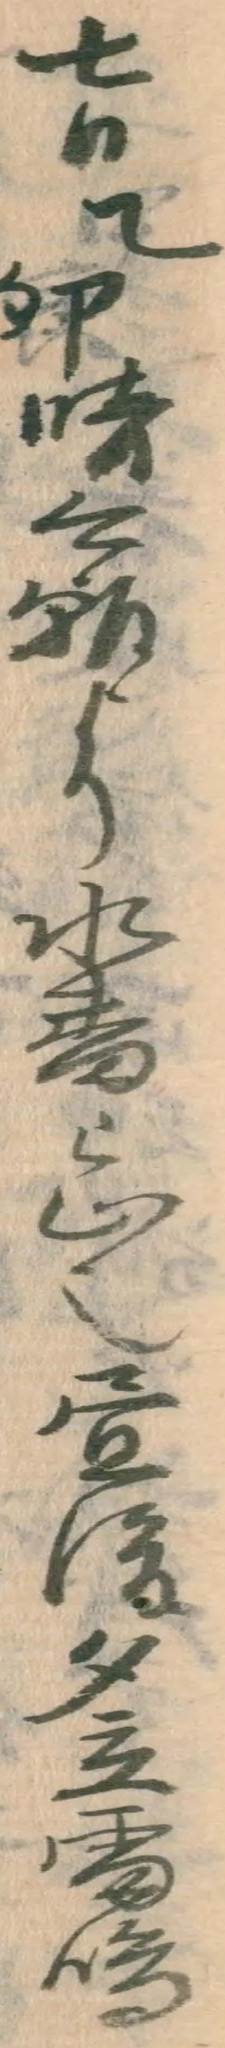七日乙卯晴、今朝より水番被止也、昼後夕立雷鳴、
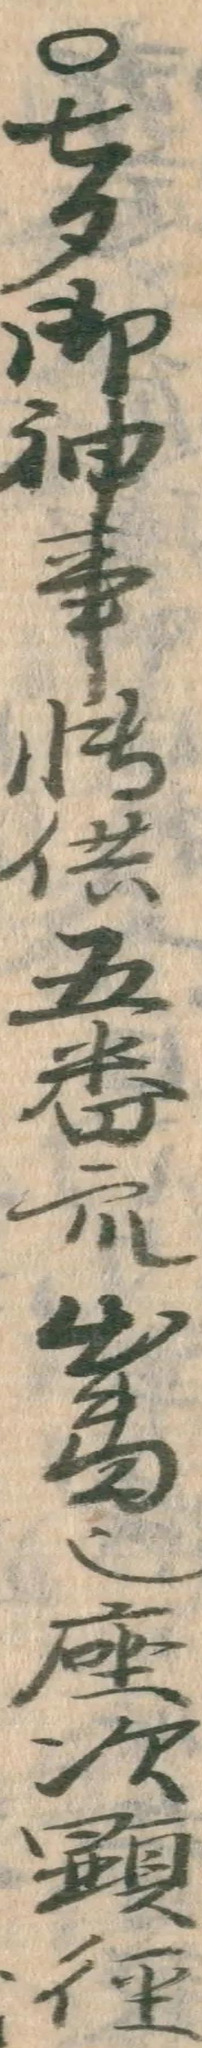○七夕御神事轉供五番衆出番也、座次顕径・
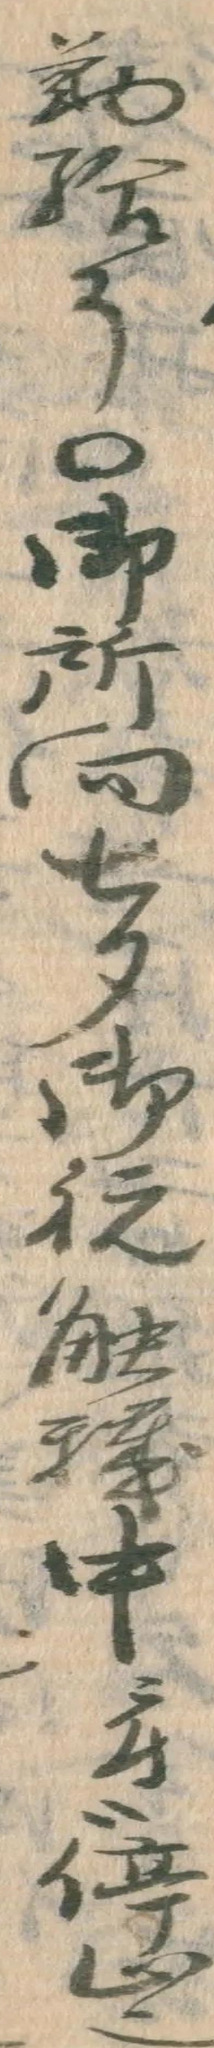勤給了、○御所向七夕御祝触穢中ニ付御停止也、
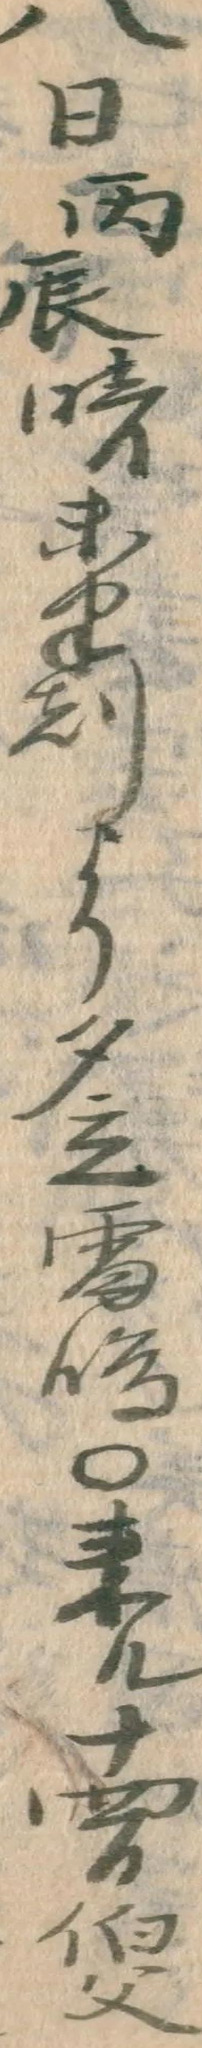八日丙辰晴、未半刻より夕立雷鳴、〇来ル十四日、伯父
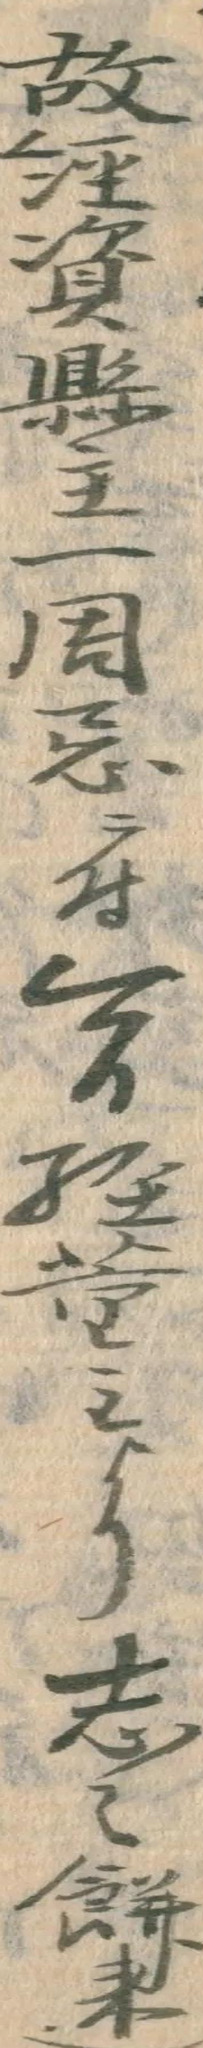故経資縣主一周忌ニ付、今日経董主より志之餅来也、
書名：賀茂社記録. 第63冊
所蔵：国立国会図書館 National Diet Library, JAPAN
